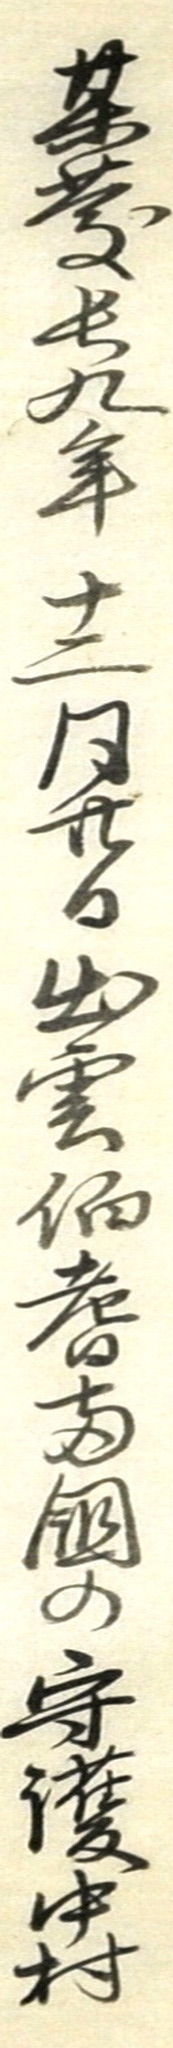某慶長九年十二月廿日出雲伯耆両国の守護中村
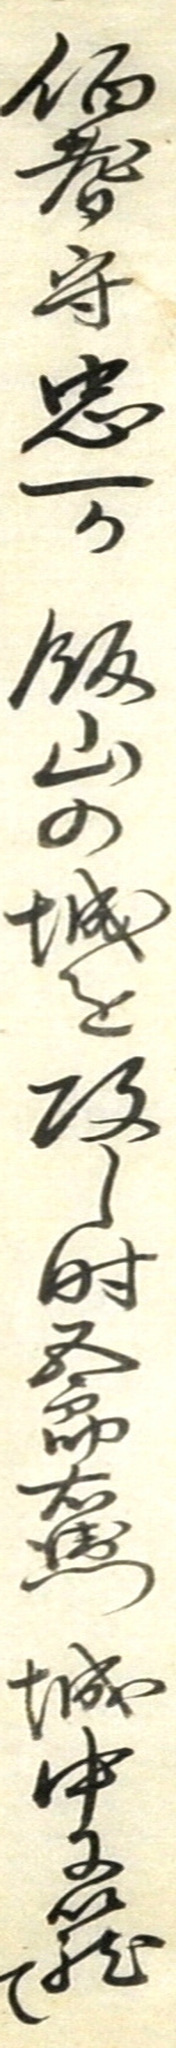伯耆守忠一か飯山の城を攻し時五郎右衛門城中に籠て
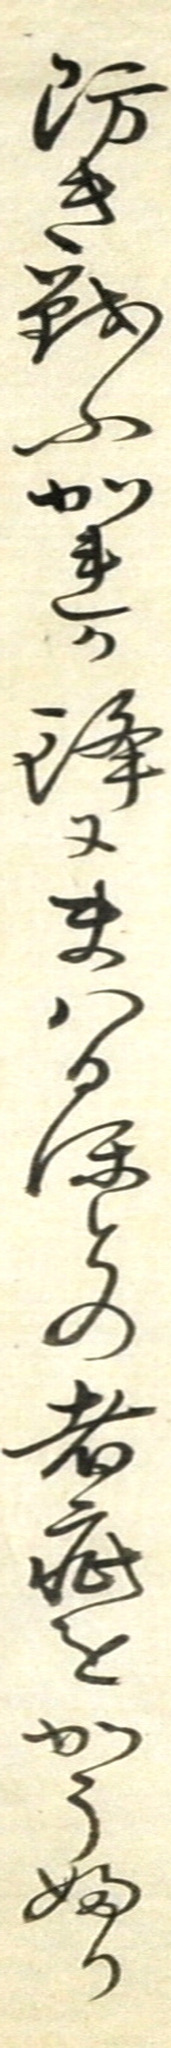防き戦ふかれか鋒にまはるほとの者疵をかうふり
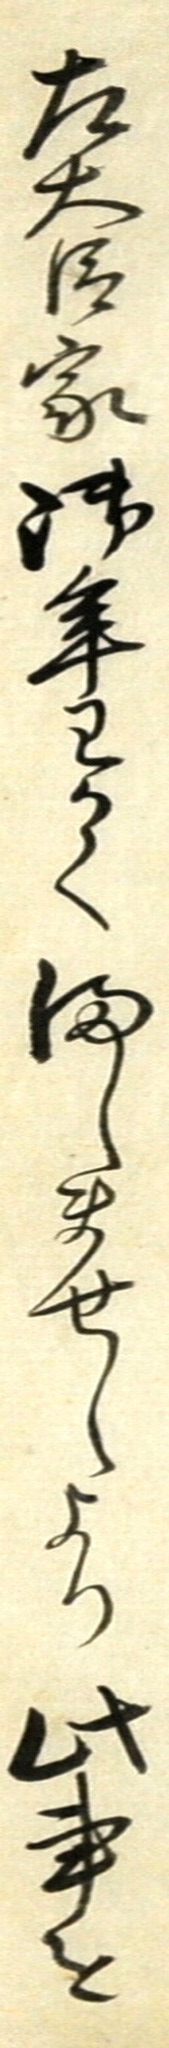左大臣家御年わかくましませしより此事を
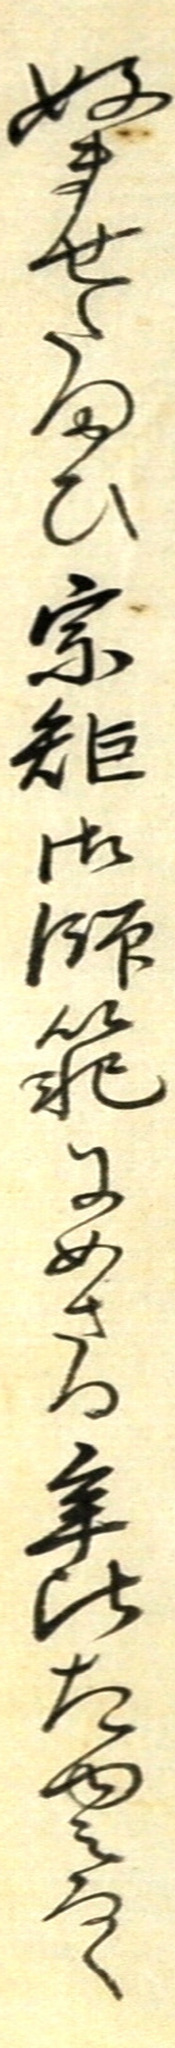好ませたまひ宗矩御師範にめさる年比たゆみなく

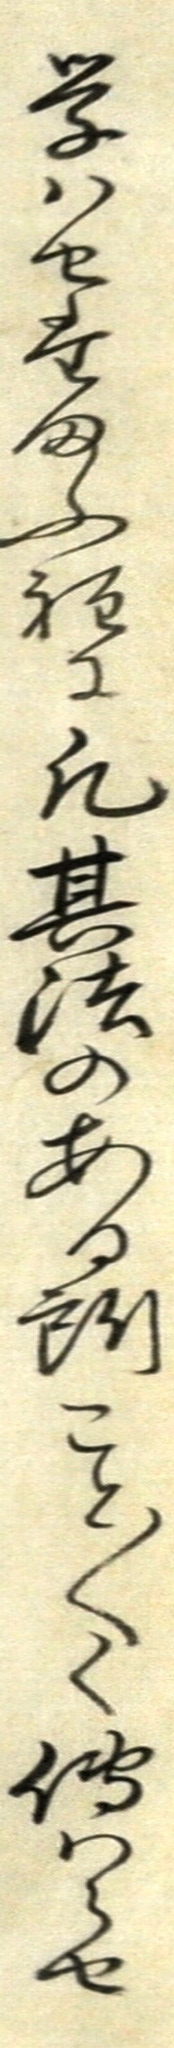学はせたまふ程に梵其法のある所こと〳〵く伝はらせ
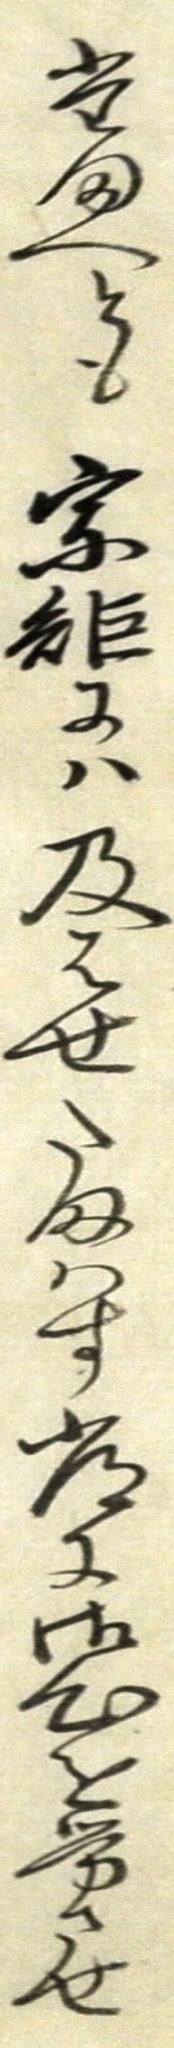たまへとも宗矩には及はせたまはす常に御心を労させ
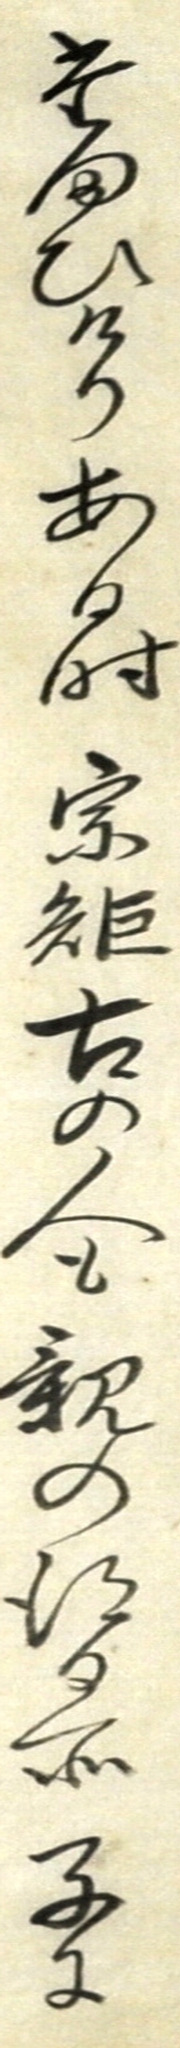たまひけりある時宗矩古の人も親の得る所子に
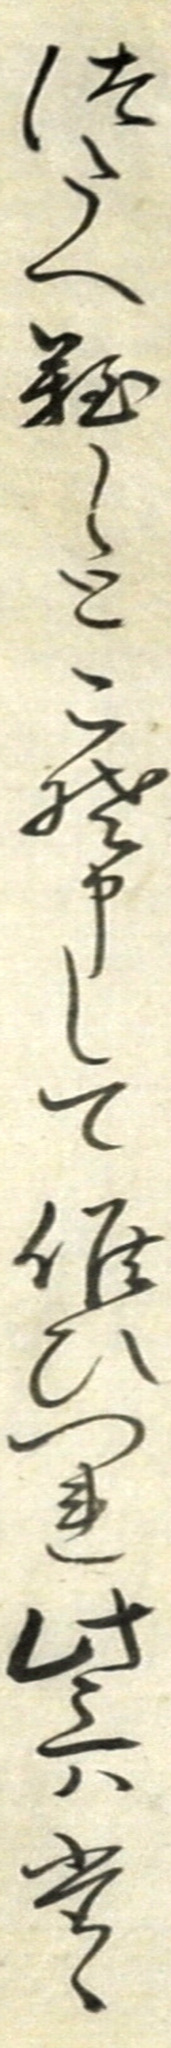つたへ難しとこそ申して候ひつれ此上はたゝ
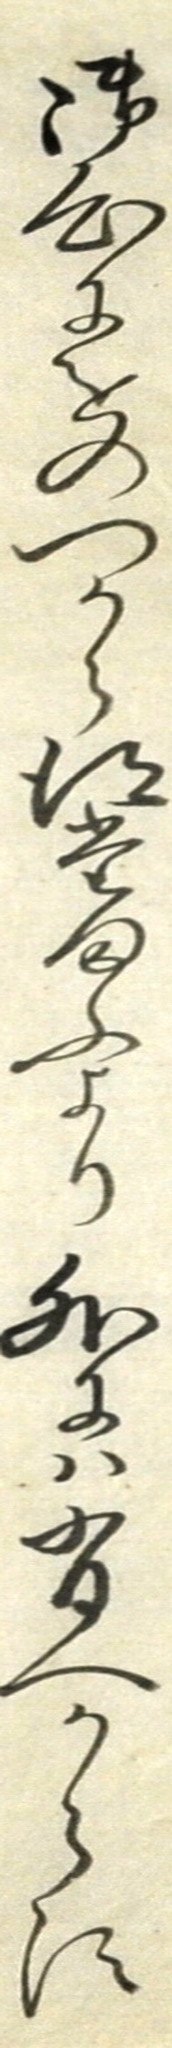御心にをのつから得たまふより外には有へからす
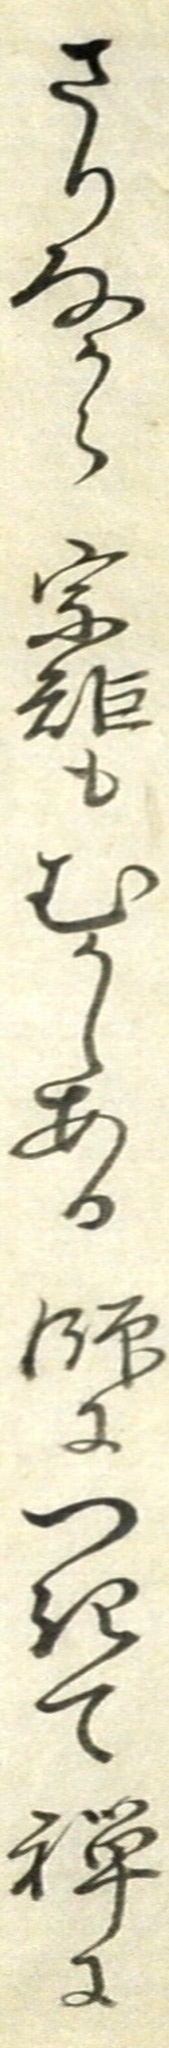さりなから宗矩もむかしある師につきて禅に
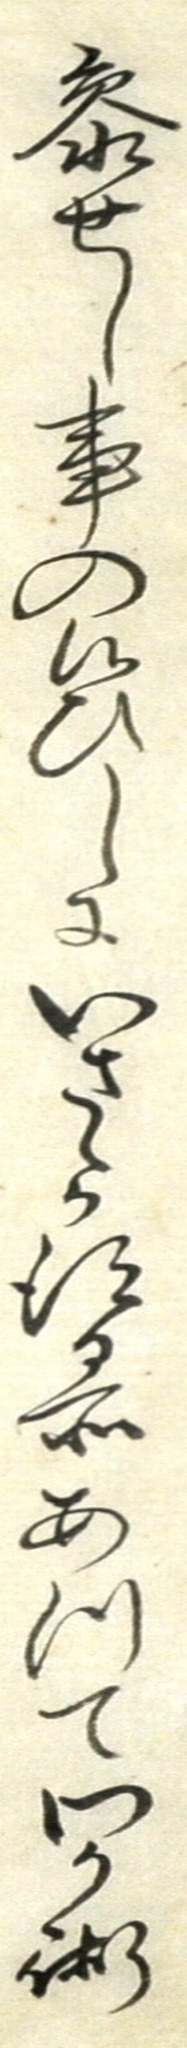参せし事の候ひしにいさゝか得る所あつてわか術
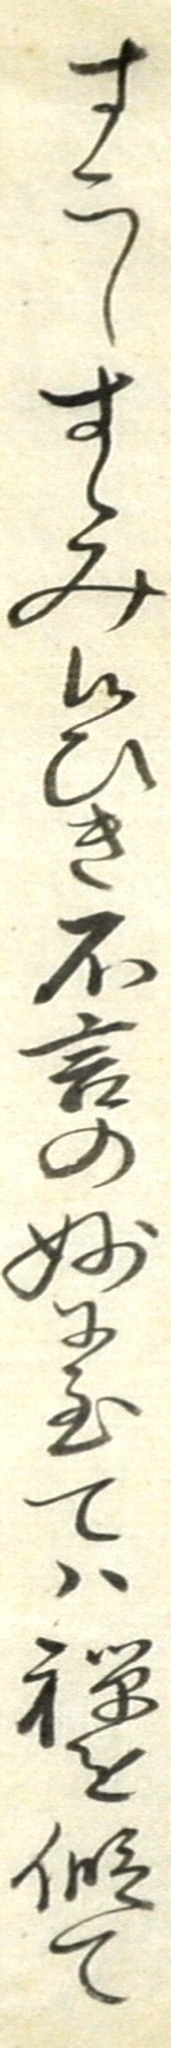すこしすゝみ候ひき不言の妙に至ては禅を仮て
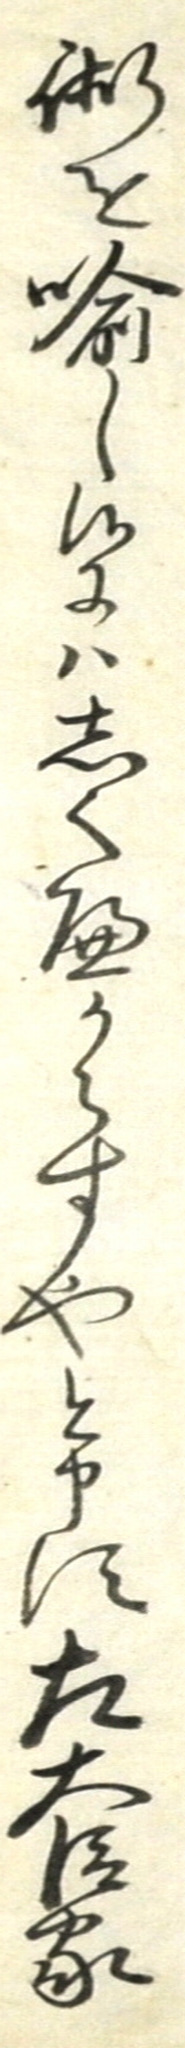術を喩し候にはしくへからすやと申す左大臣家
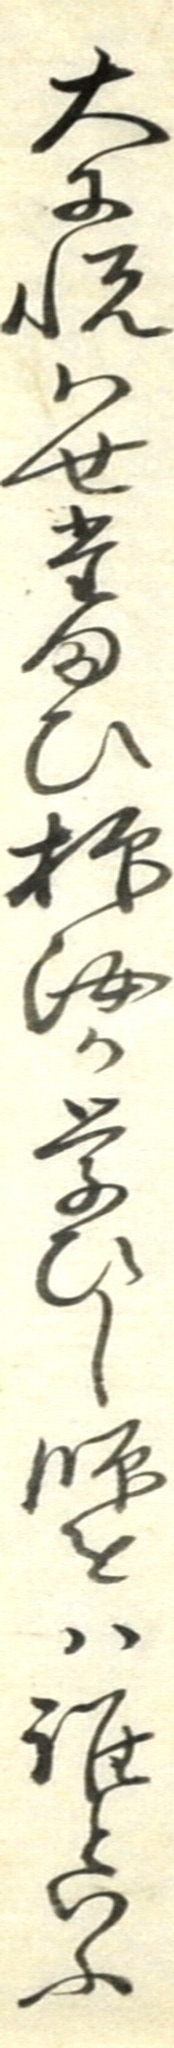大に悦はせたまひ抑汝か学ひし師をは誰といふ
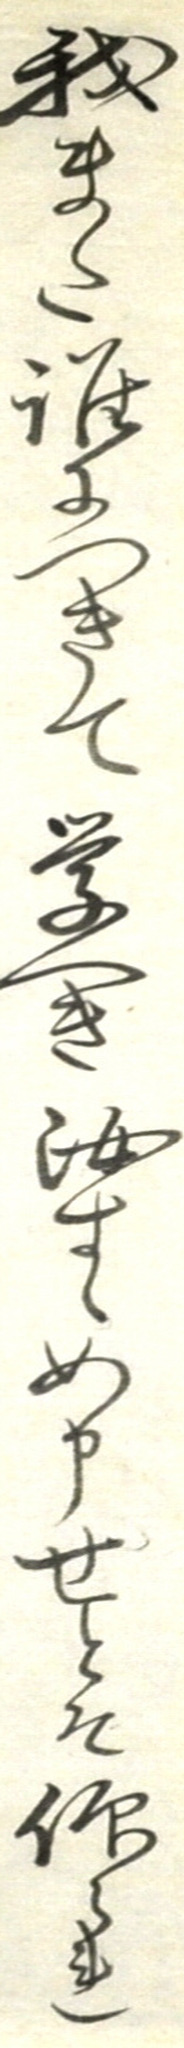我また誰につきて学へき汝すゝめ申せとそ仰られ
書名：藩翰譜（六）
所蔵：伊那市立高遠町図書館・合同会社AMANE
